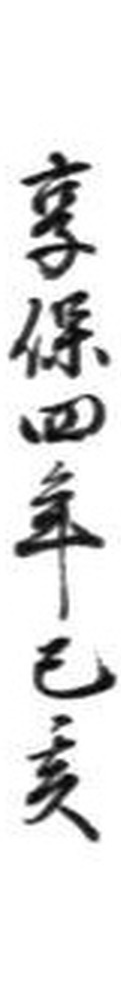享保四年己亥
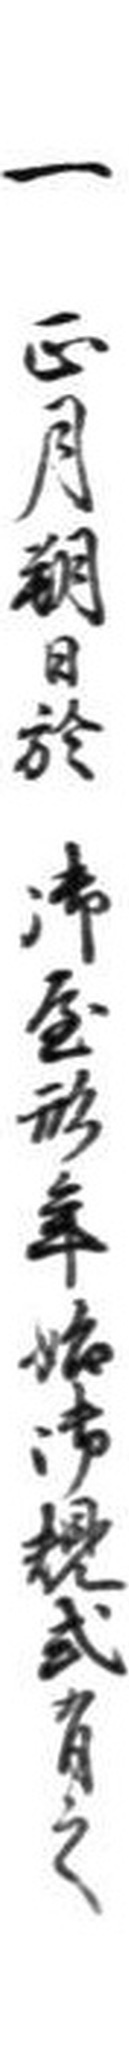一正月朔日於御屋形年始御規式有之
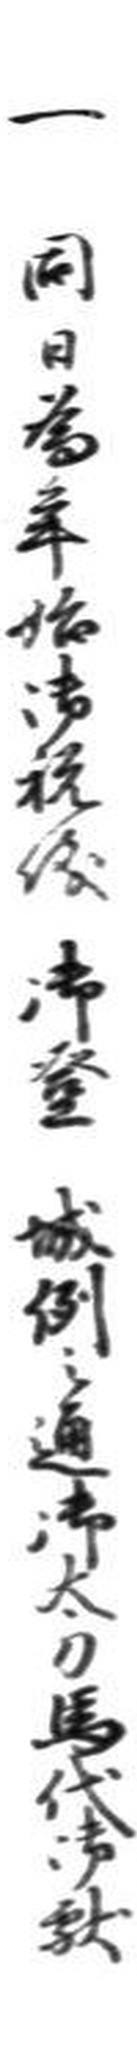一同日為年始御祝儀御登城例之通御太刀馬代御献
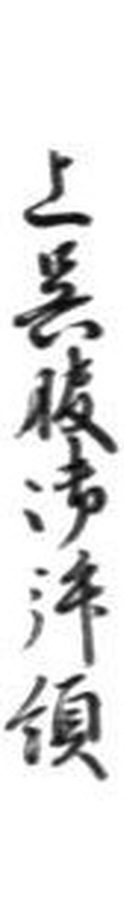上呉服御拝領
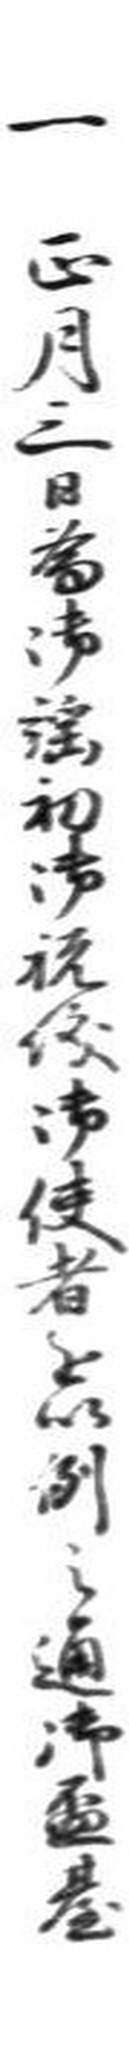一正月三日為御謡初御祝儀御使者を以例之通御盃台
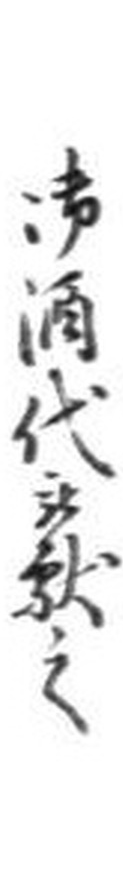御酒代被献之
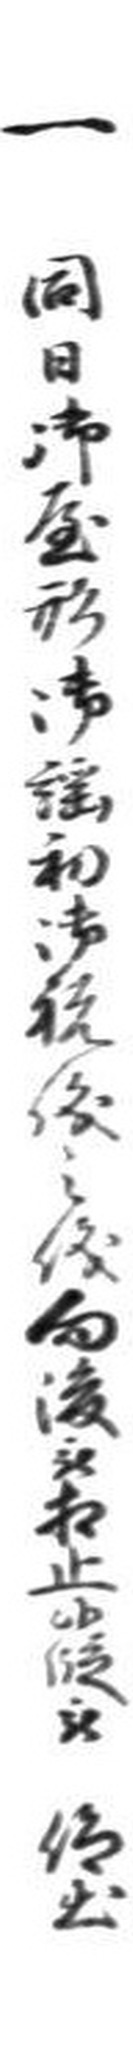一同日御屋形御謡初御祝儀之儀向後被相止候段被仰出
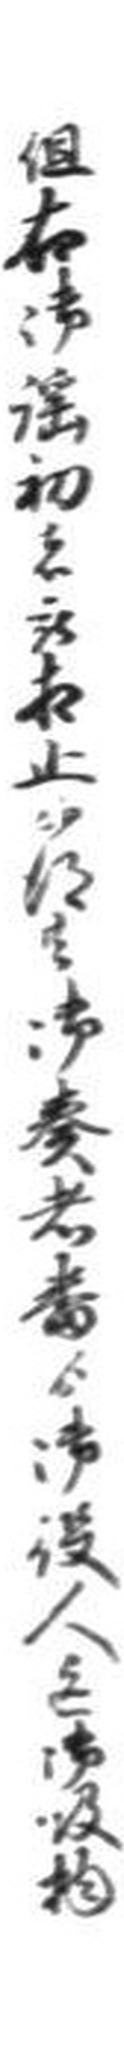但右御謡初者被相止候得共御奏者番ゟ御役人迄御吸物

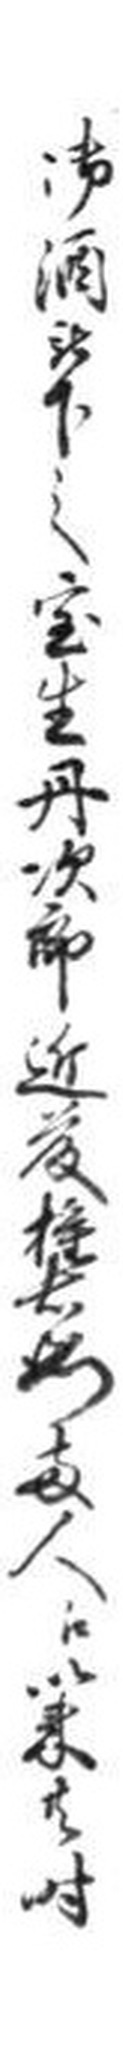御酒被下之宝生丹次郎近藤権右衛門両人江以来共時
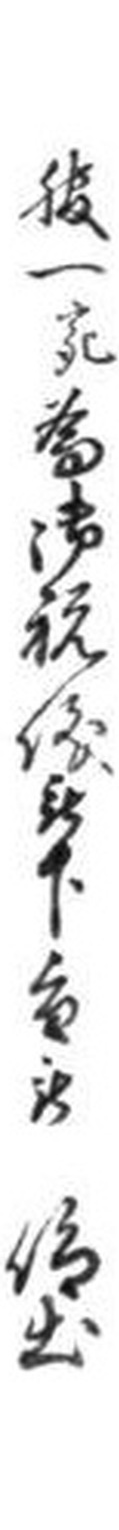服一宛為御祝儀被下旨被仰出
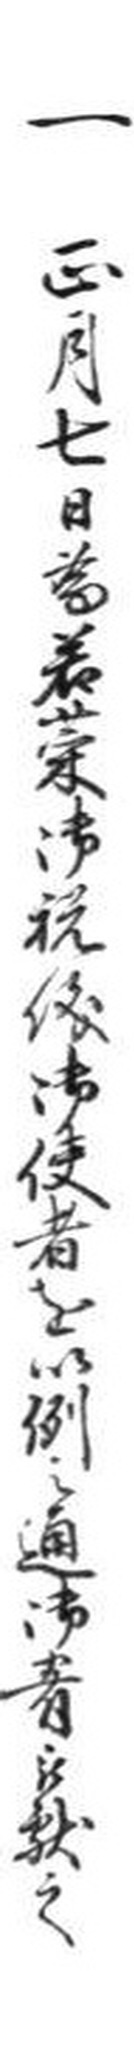一正月七日為若菜御祝儀御使者を以例之通御肴被献之
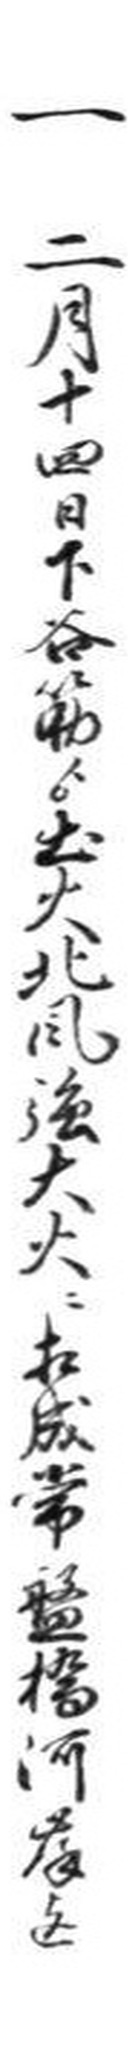一二月十四日下谷筋ゟ出火北風強大火ニ相成常盤橋河岸迄
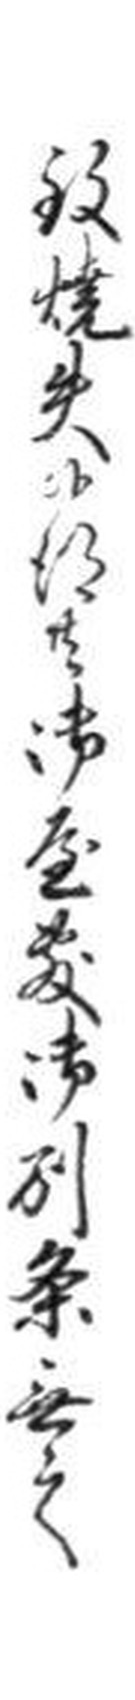致焼失候得共御屋敷御別条無之
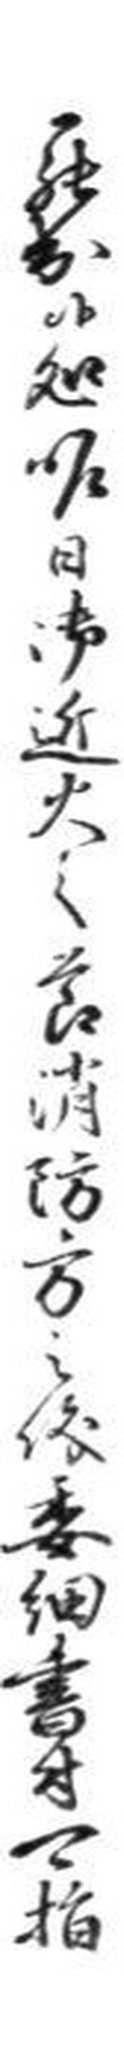罷出候処昨日御近火之節消防方之儀委細書付可指
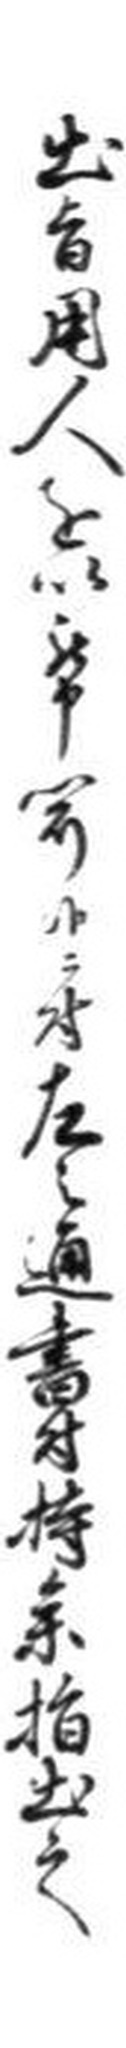出旨用人を以被申聞候ニ付左之通書付持参指出之
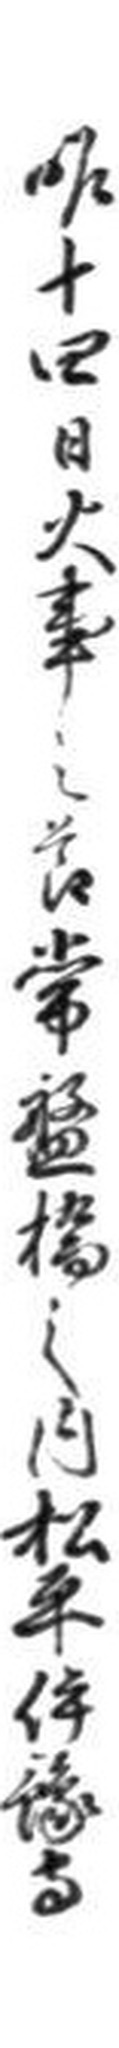昨十四日火事之節常盤橋之内松平伊予守
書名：家譜 三十三 吉邦公 享保四年
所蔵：福井県文書館 Fukui Prefectural Archives
